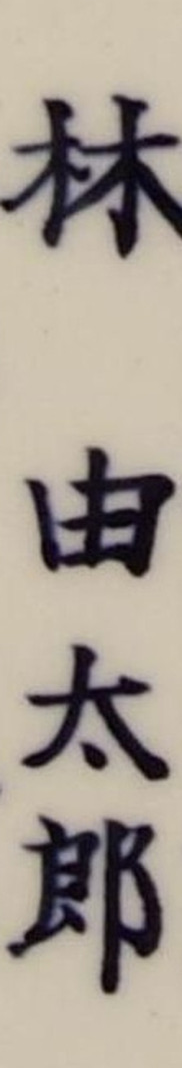林由太郎
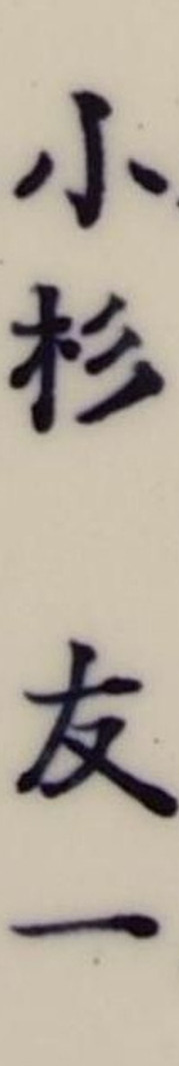小杉友一
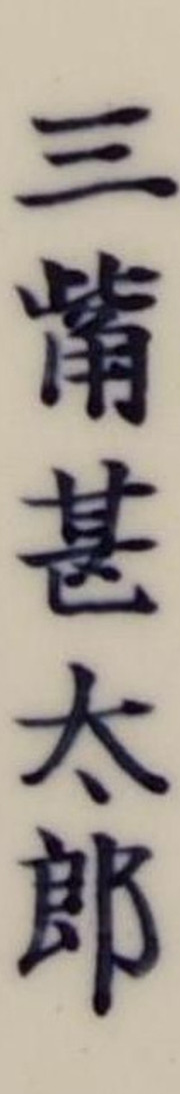三觜甚太郎
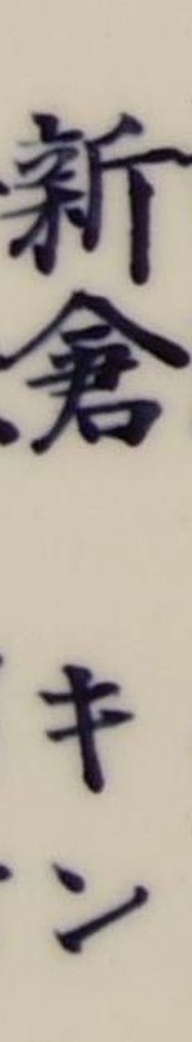新倉キン
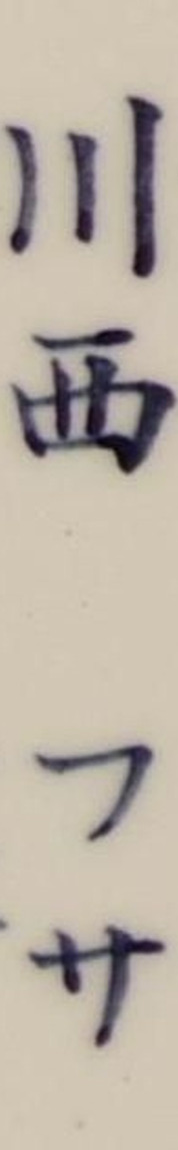川西フサ
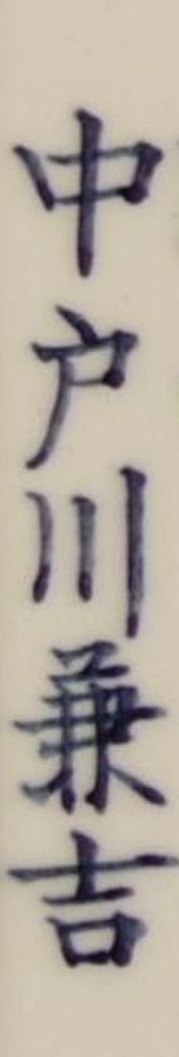中戸川兼吉

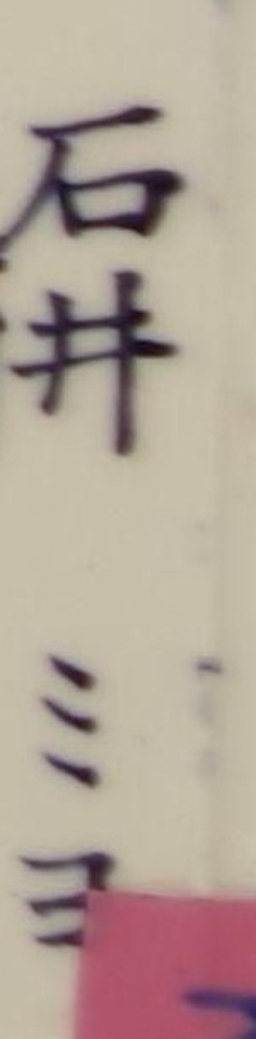石井ミヨ
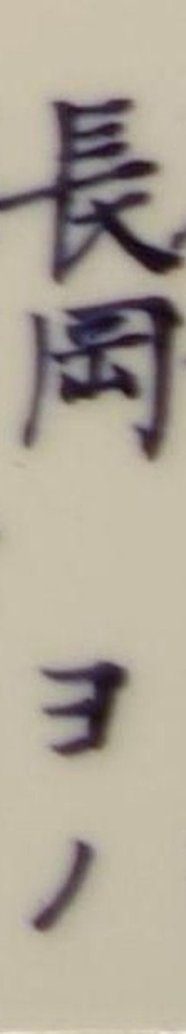長岡ヨノ
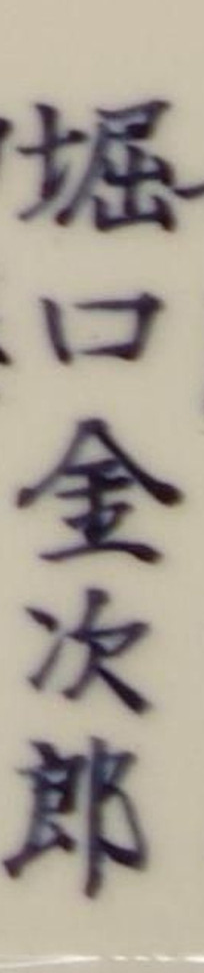堀口金次郎
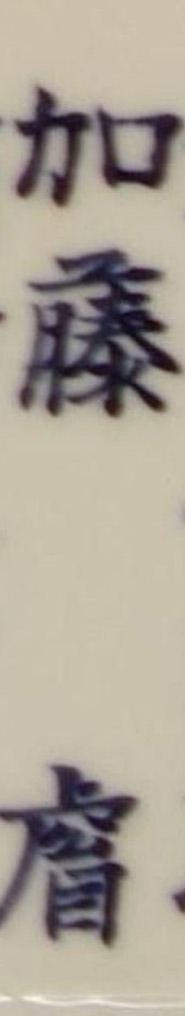加藤叡
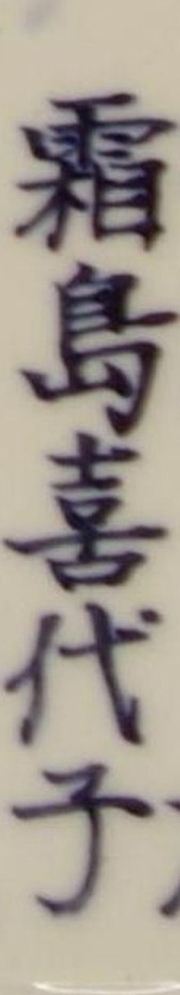霜島喜代子
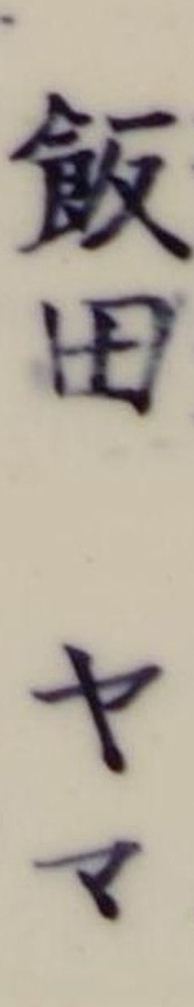飯田ヤマ
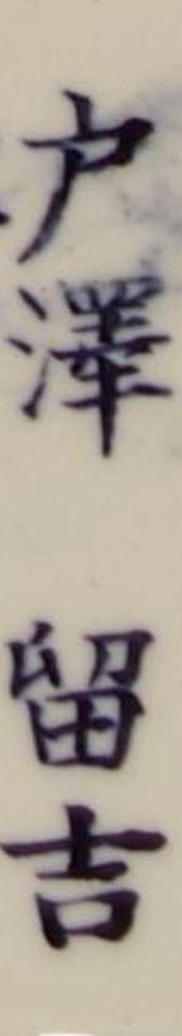戸澤留吉
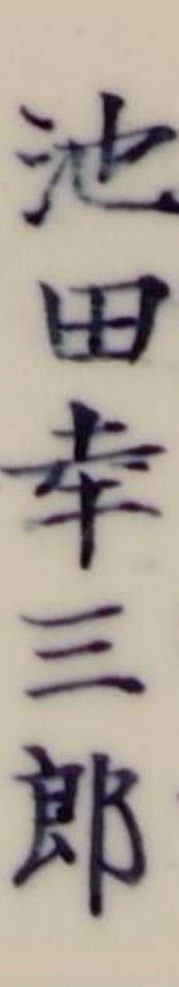池田幸三郎
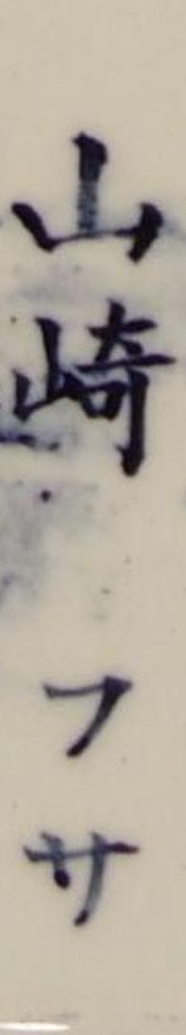山崎フサ
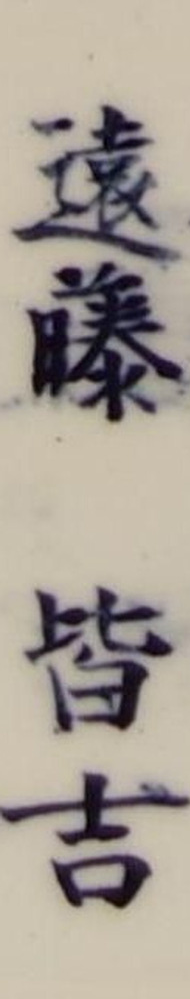遠藤皆吉
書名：M~S
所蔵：高野山金剛峯寺
